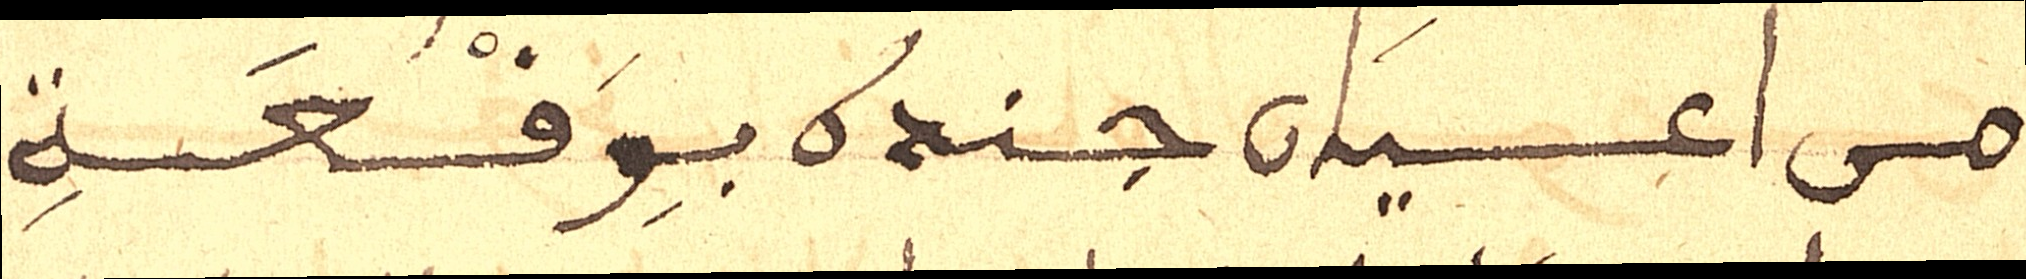من اعيان جنده بوقعة
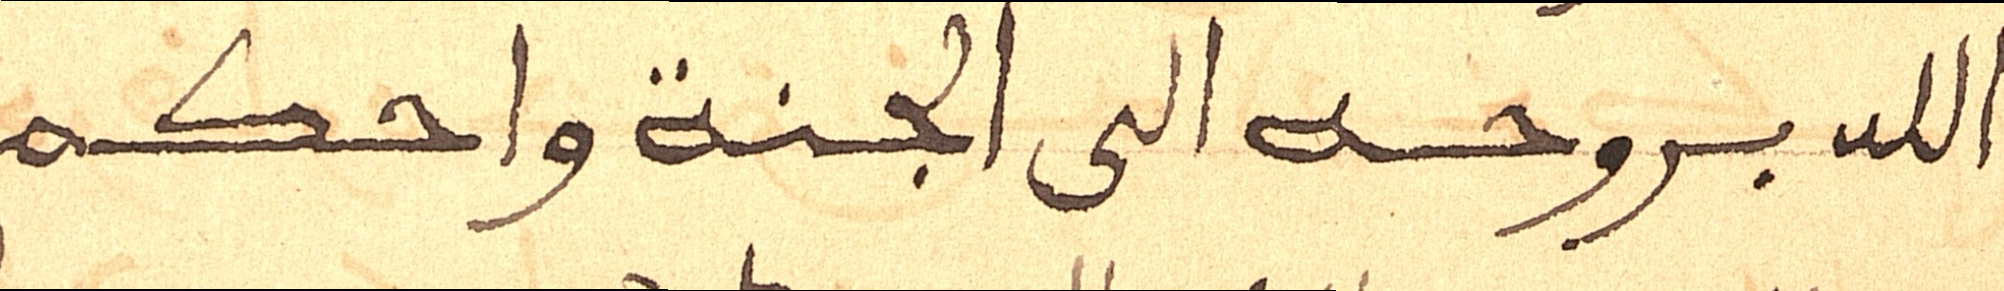الله بروحه الى الجنة واحكم
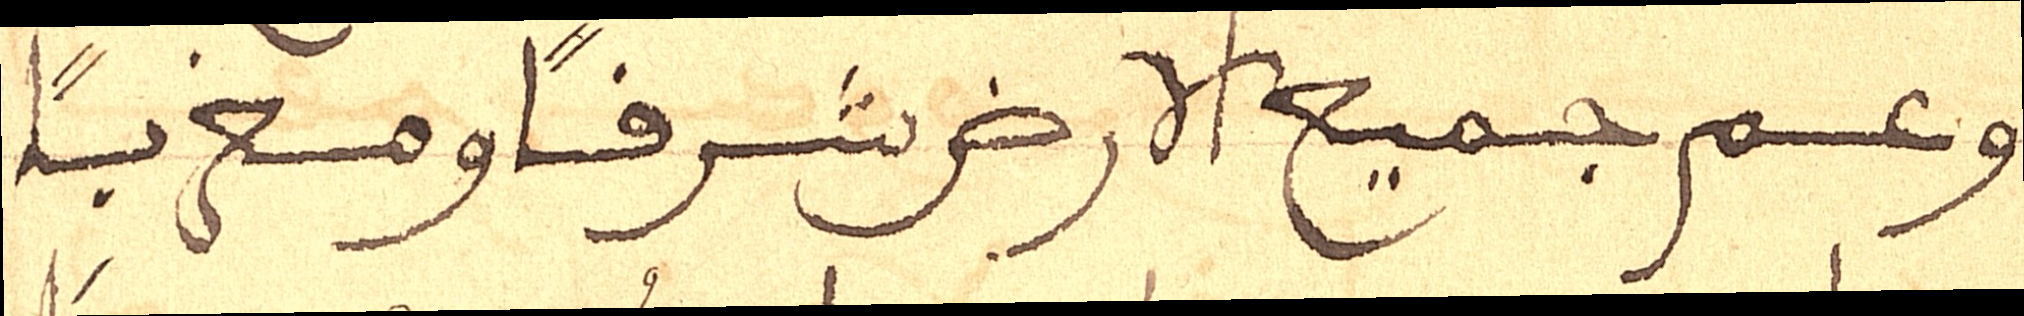وعم جميع الارض شرقا ومغربا
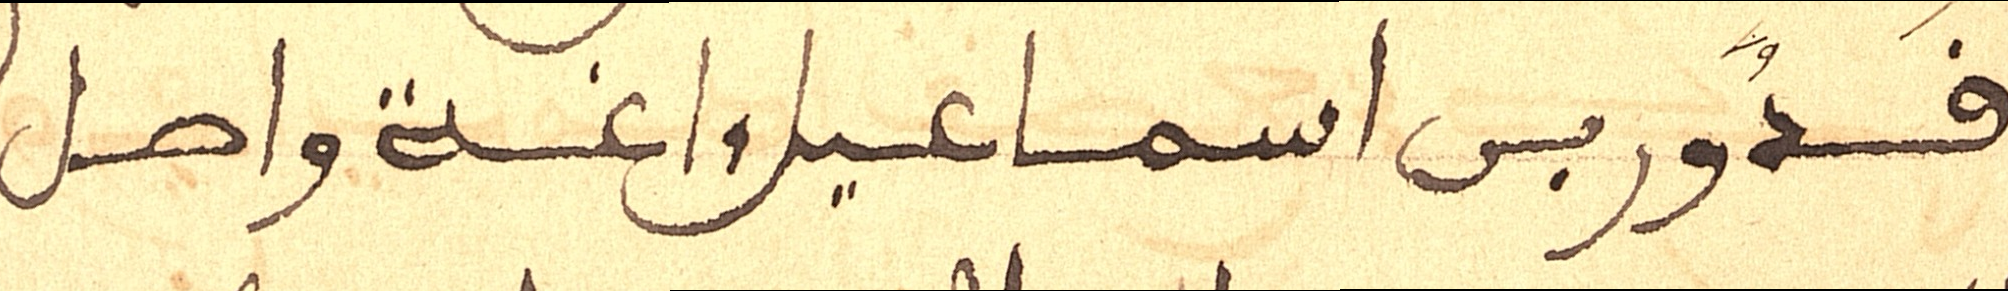قدور بن اسماعيل ءاغة واصل
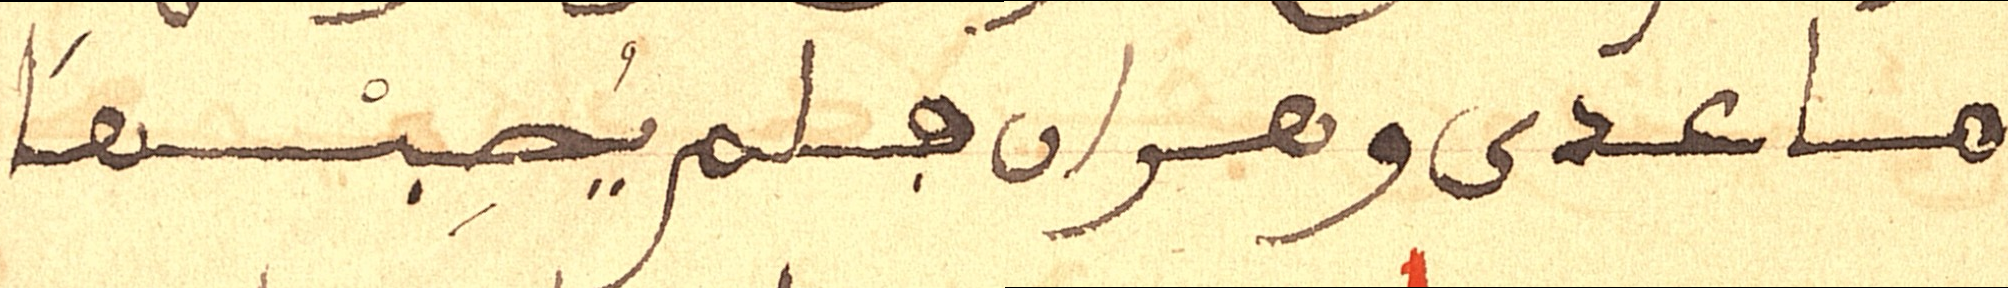ماعدى وهران فلم يصبها
